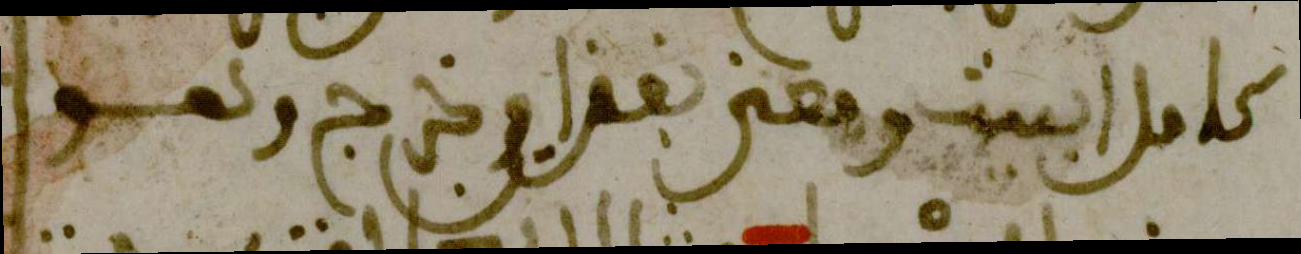كامل البيت ومعنى نقذا اي خرج وهو
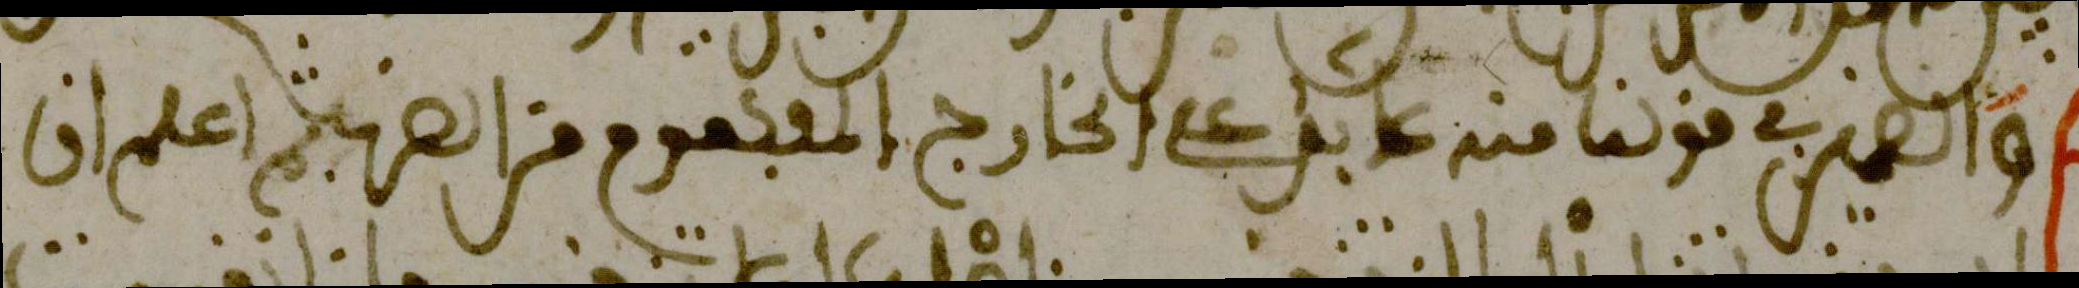والضمير في قولنا منه عائد على الخارج المفهوم من الضرب ثم اعلم ان
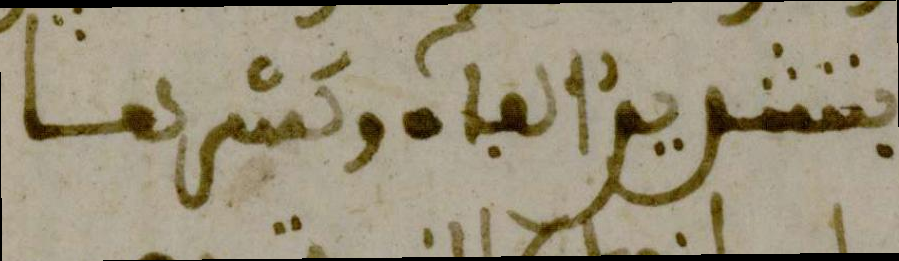بتشديد الفاء وكسرها
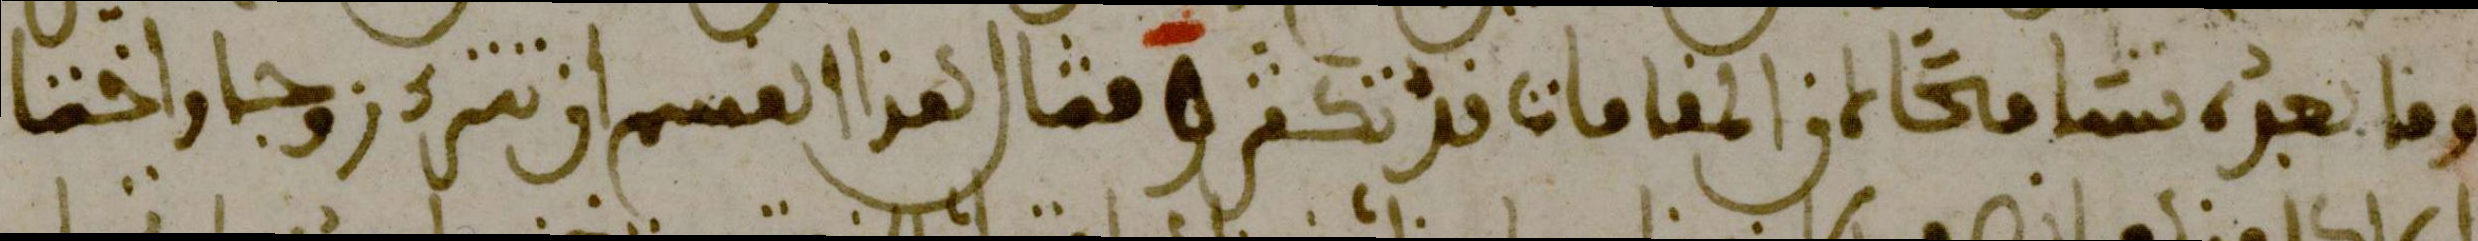وما بعده تسامحا لان المقامات قد تكثر ومثال هذا القسم ان تترد زوجا واختا
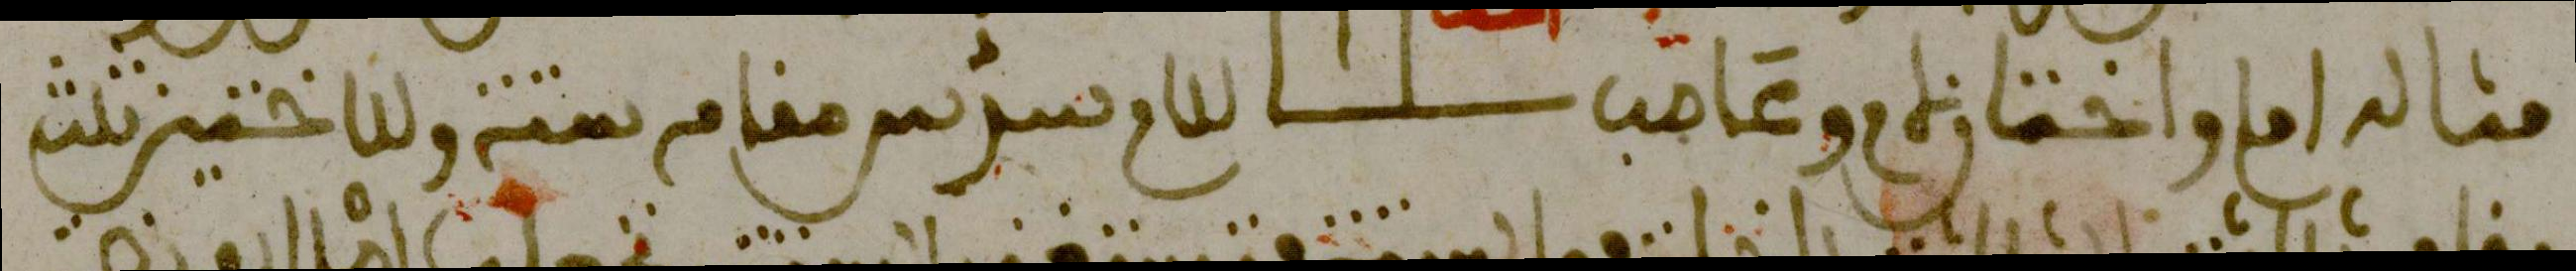مثاله ام واختان لام وعاصب للام سدس مقامه ستة وللاختين ثلث
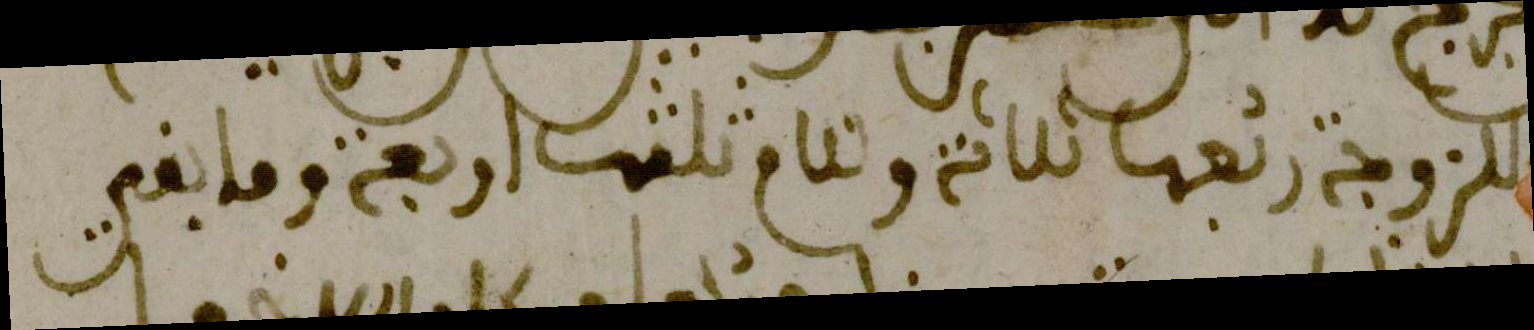للزوجة ربعها ثلاثة وللام ثلثها اربعة وما بقي
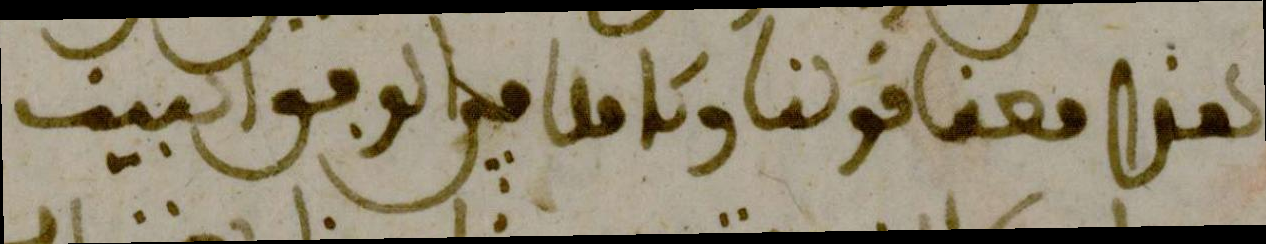هذه معنا قولنا وكاملا في الوفق البيت
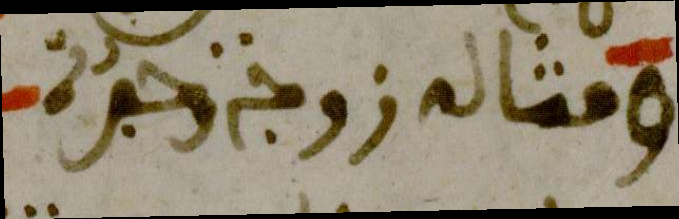ومثاله زوجة وجده
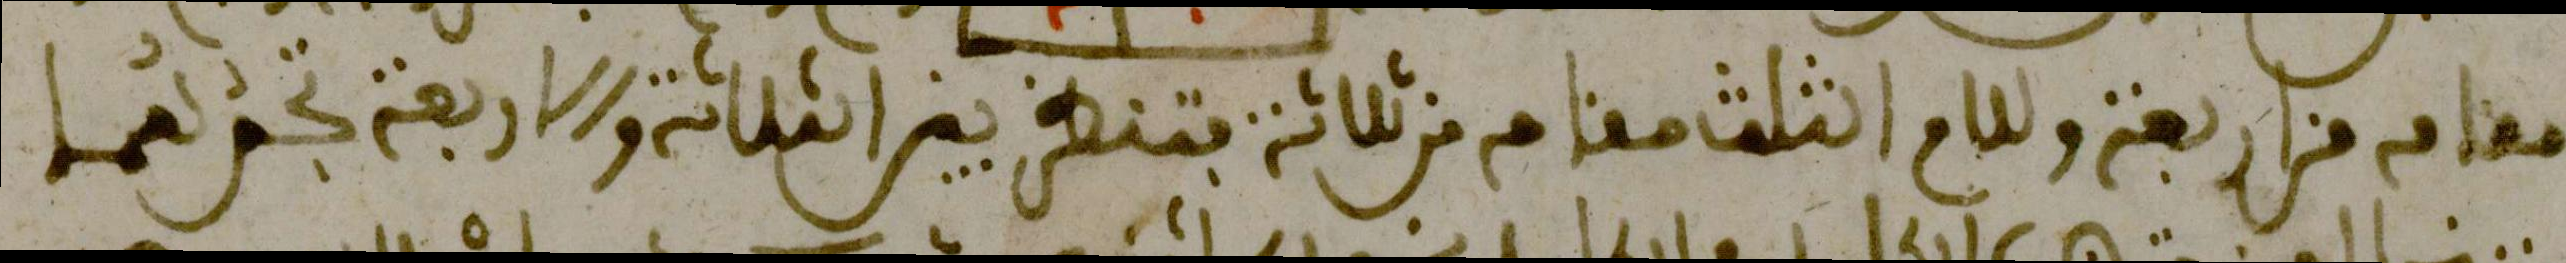مقامه من اربعة وللام الثلث مقامه من ثلاثة فتنظر بين الثلاثة والاربعة تجدهما
